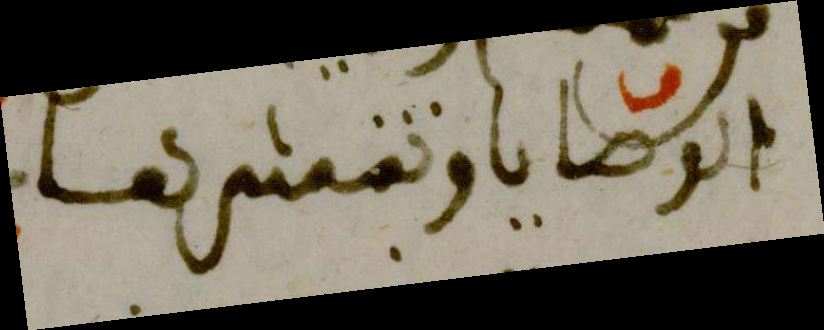الوصايا وتشرها
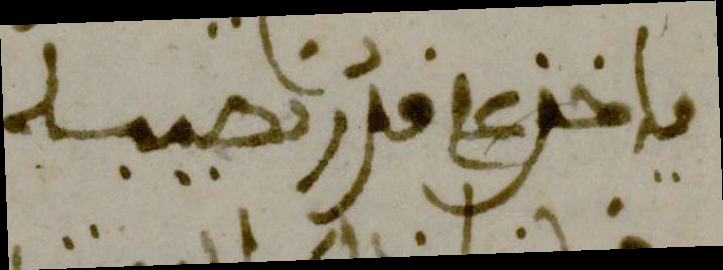ياخذ على قدر نصيبه
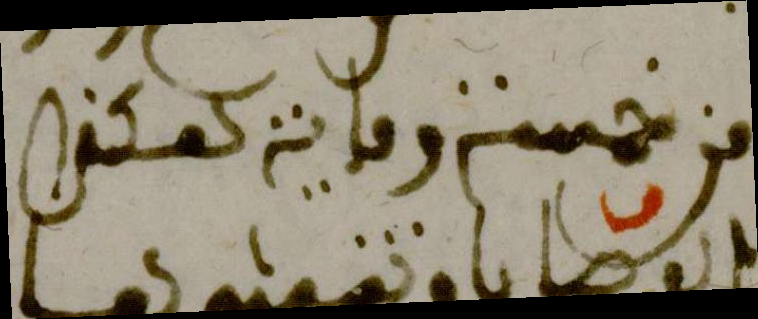من خمسة وماية هكذا
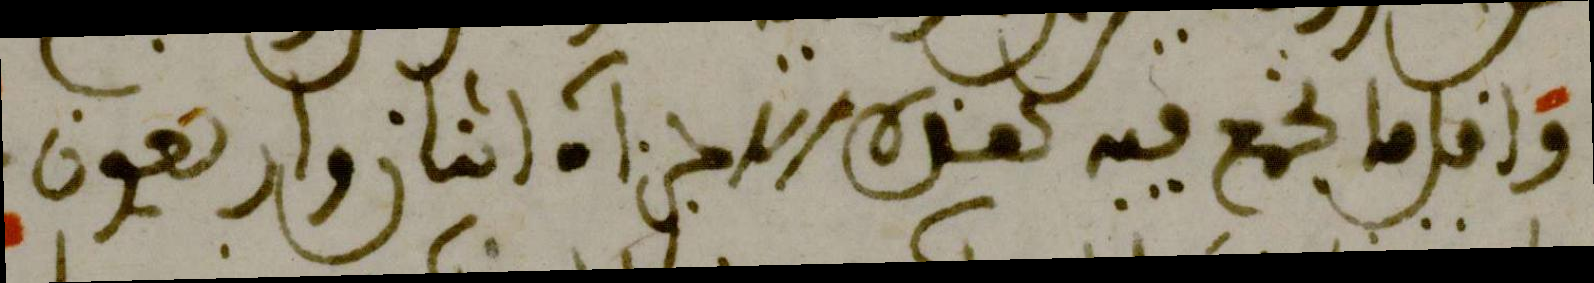وَاقل ما تجتمع فيه هذه الاجزاء اثنان واربعون
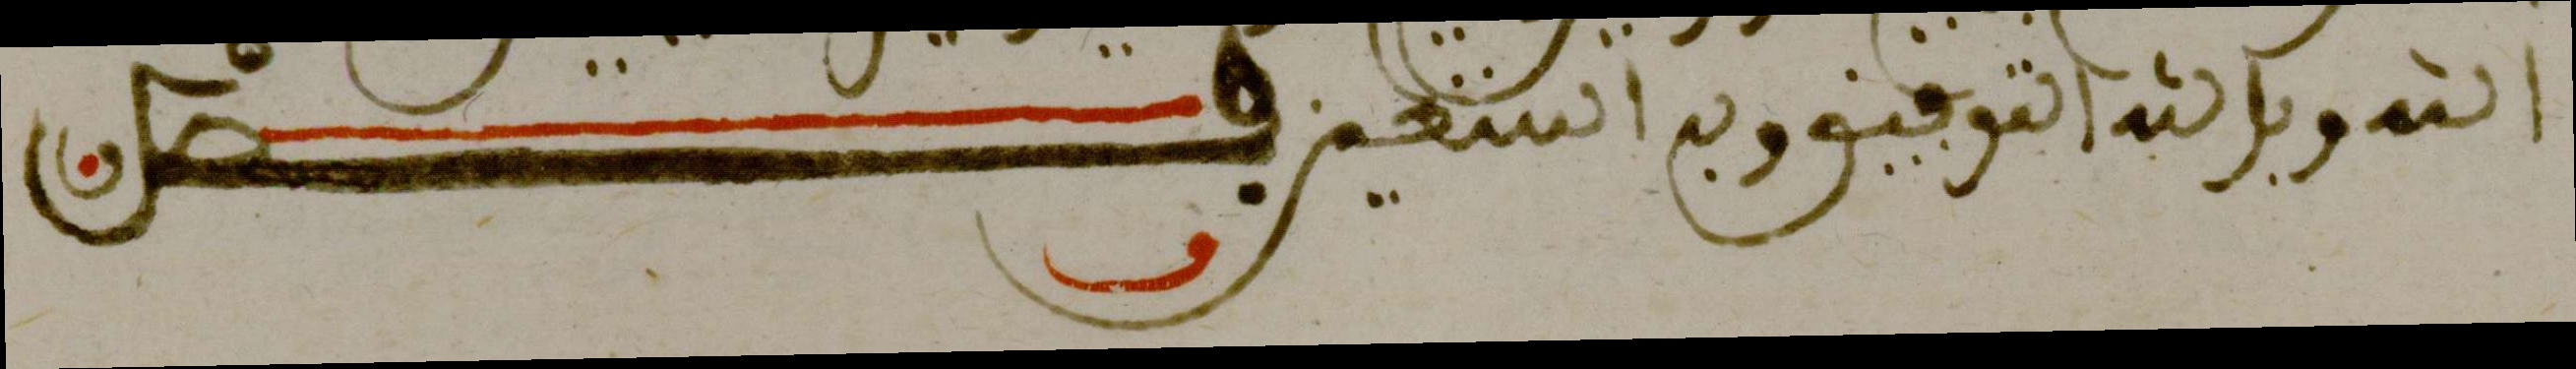الله وبالله التوفيق وبه استعين فَصْل
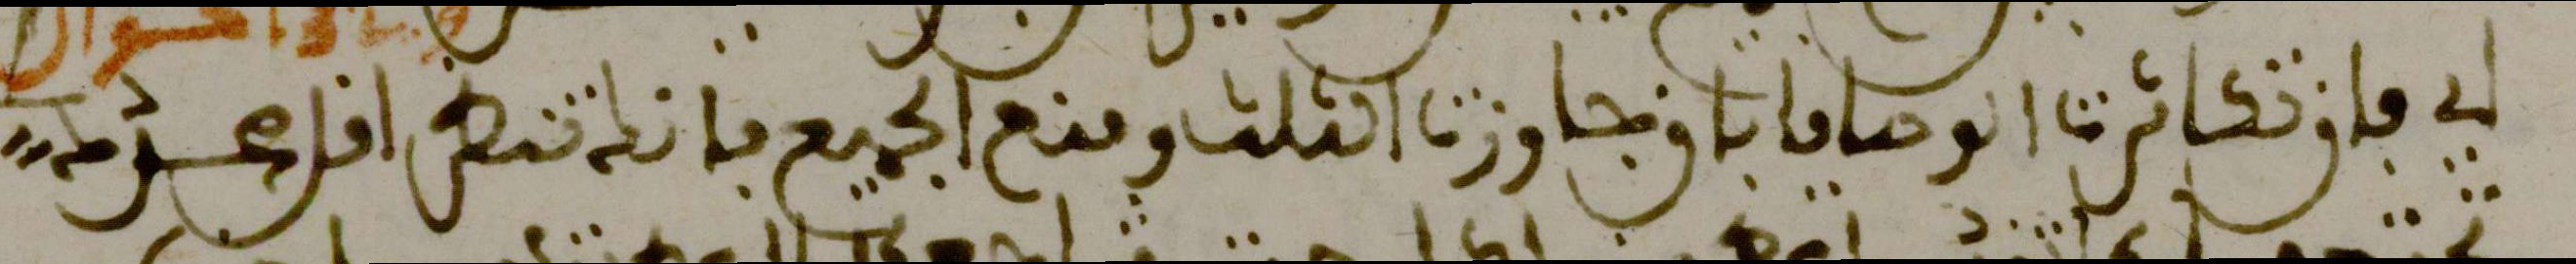اي وان تكاثرت الوصايا بان جاوزت الثلث ومنع الجميع فانك تنظر اقل عدد
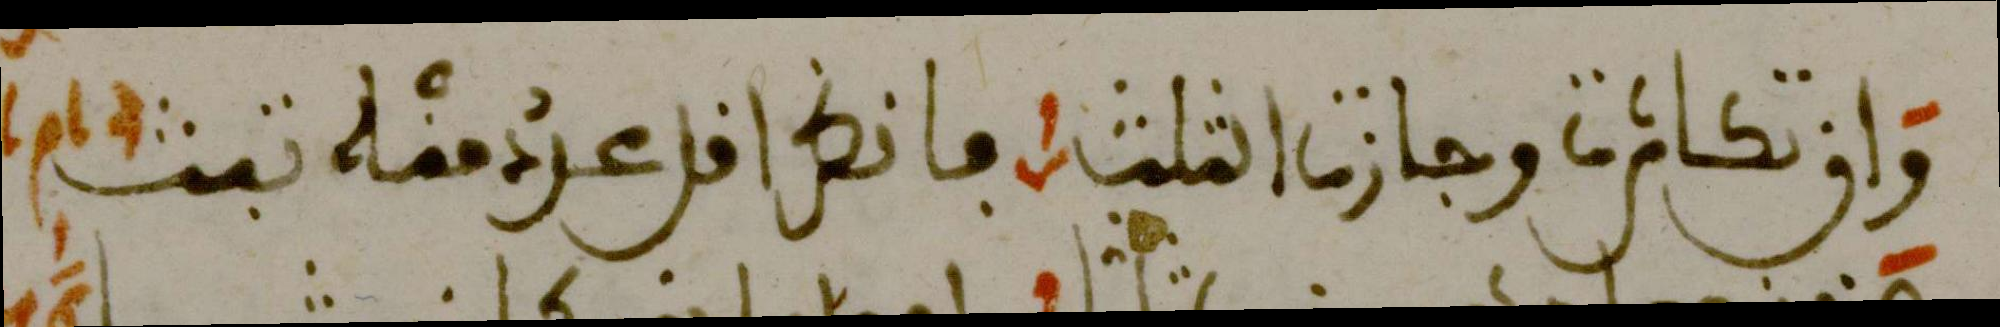وَان تكاثرت وجازت الثلث فانظر اقل عدد منْه تبث
